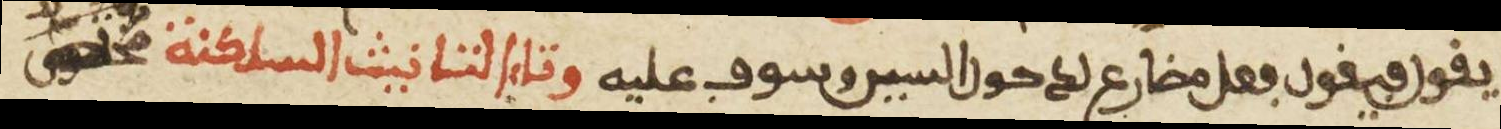يقول فيقول فعل مضارع لدخول السين و سوف عليه و تاء التانيث الساكنة
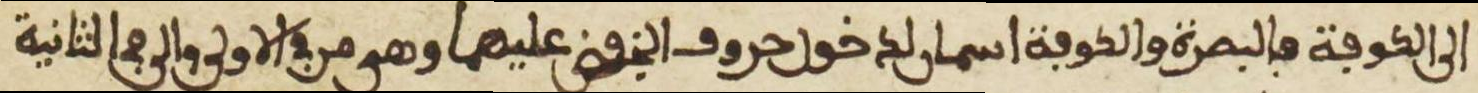الى الكوفة فالبصرة و الكوفة اسمان لدخول حروف الخفض عليها و هي من في الاولى و الى في الثانية
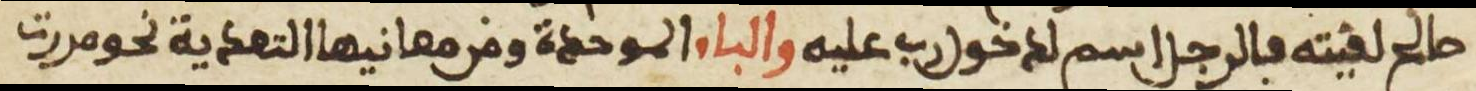صالح لقيته بالرجل اسم لدخول رب عليه و الباء الموحدة و من معانيها التعدية نحو مررت
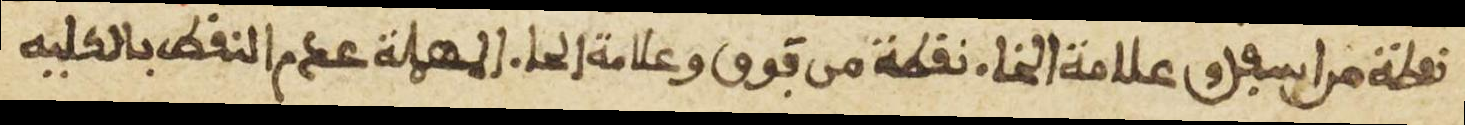نقطة من اسفل علامة الخاء نقطة من فوق و علامة الحاء المهملة عدم النقط بالكلية
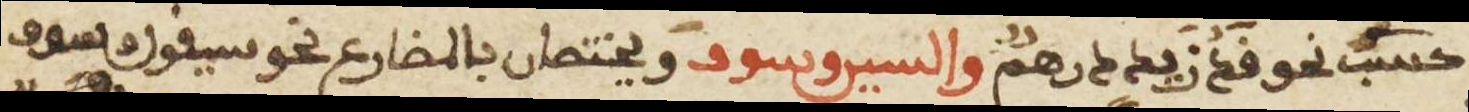حسب نحو قد زيد درهم و السين و سوف و يختصان بالمضارع نحو سيقول و سوف
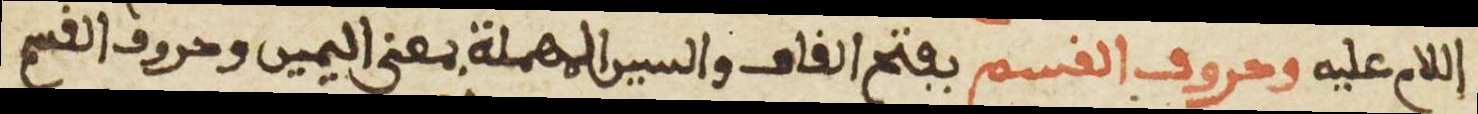اللام عليه و حروف القسم بفتح القاف و السين المهملة بمعنى اليمين و حروف القسم
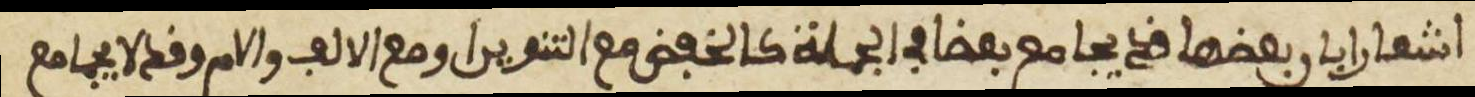اشعارا بان بعضها قد يجامع بعضا في الجملة كالخفض مع التنوين او مع الاف و اللام و قد لا يجامع
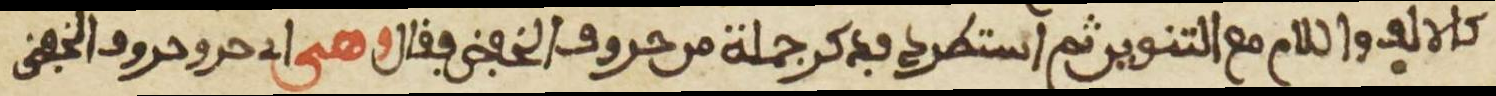كالالف و اللام مع التنوير ثم استطرد فذكر جملة من حروف الخفض فقال و هي اى حروف الخفض
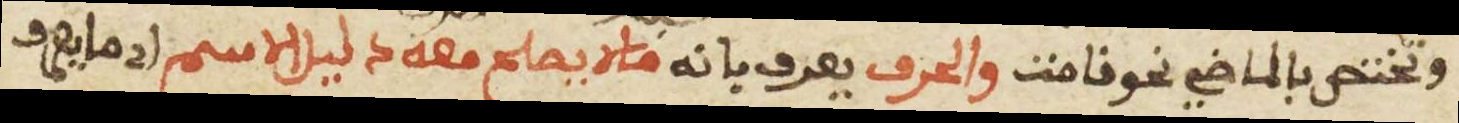و تختص بالماضي نحو قامت و الحرف يعرف بانه ملا يصلح معه دليل الاسم اى ما يعرف
